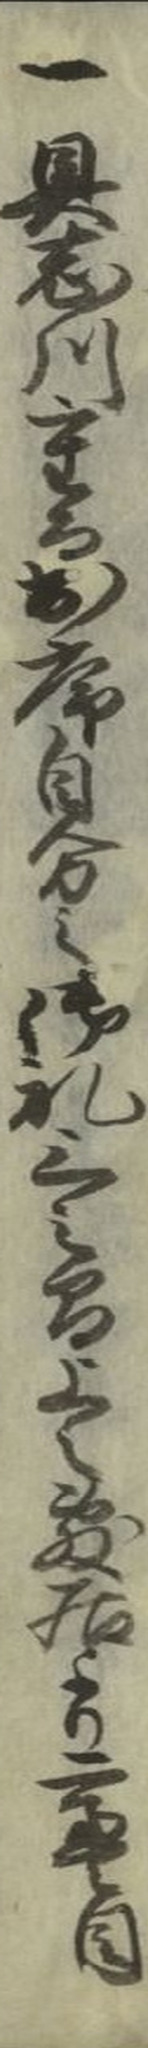一具志川重而出席自分之御礼三之間上之より敷居二畳目
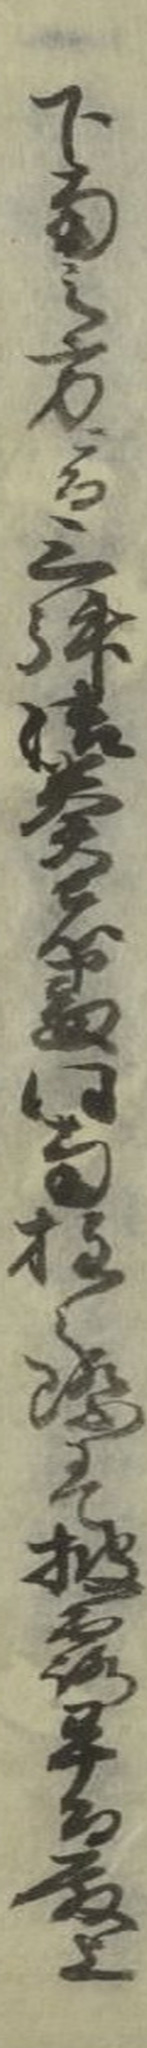下南之方に而三拝御奏者番同南柱之際にて披露畢而殿上
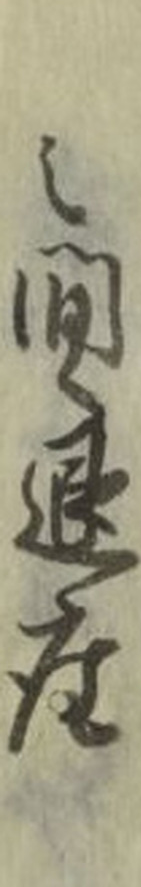之間退座
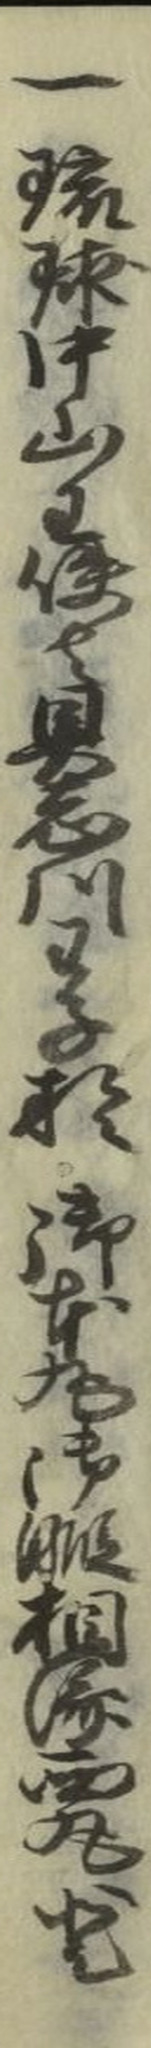一琉球中山王使者具志川王子於御本丸御相済西丸へ登
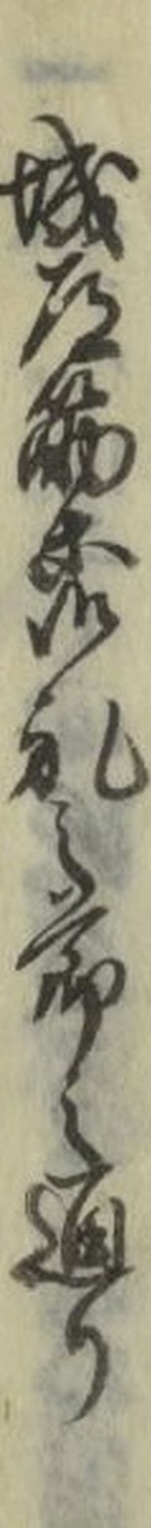城道筋等御礼之節之通り
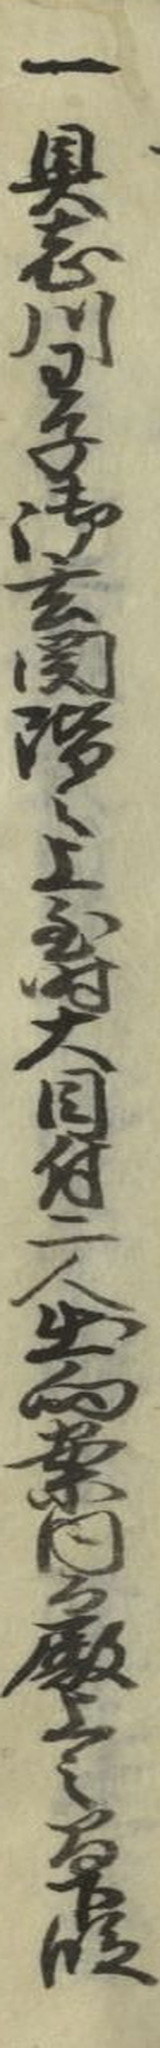一具志川王子御玄関階之上至時大目付二人出向案内而殿上之間下段
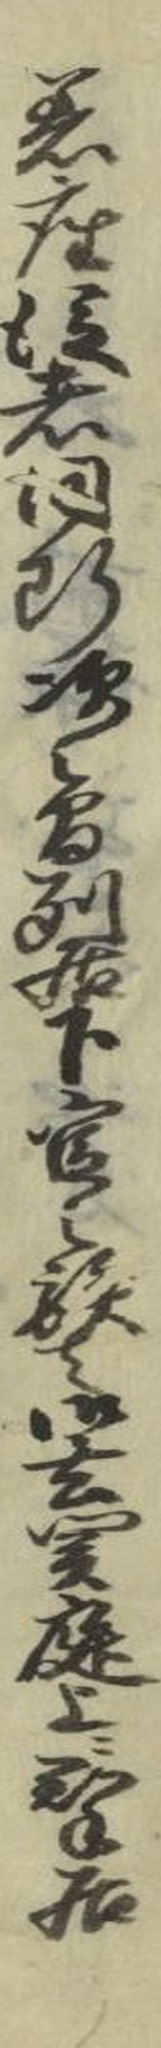着座従者同断次之間列居下官之族は御玄関庭上に撃居
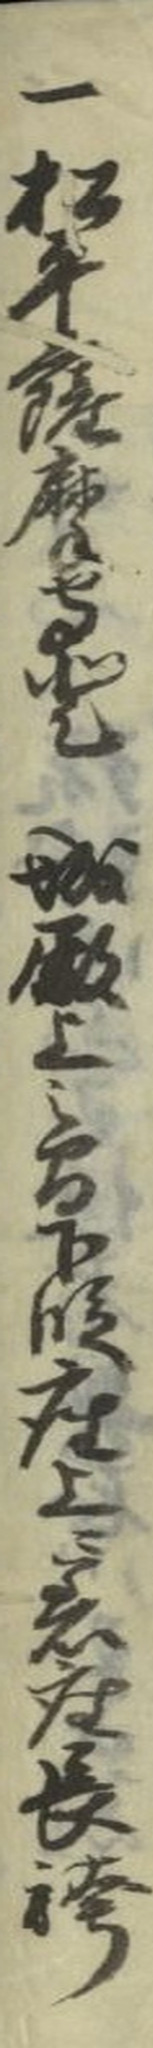一松平薩摩守登城殿上之間下段座上に着座長袴
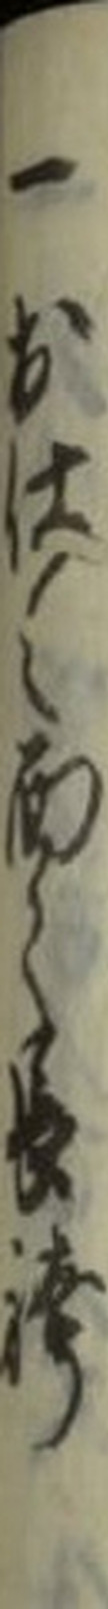一出仕之面々長袴
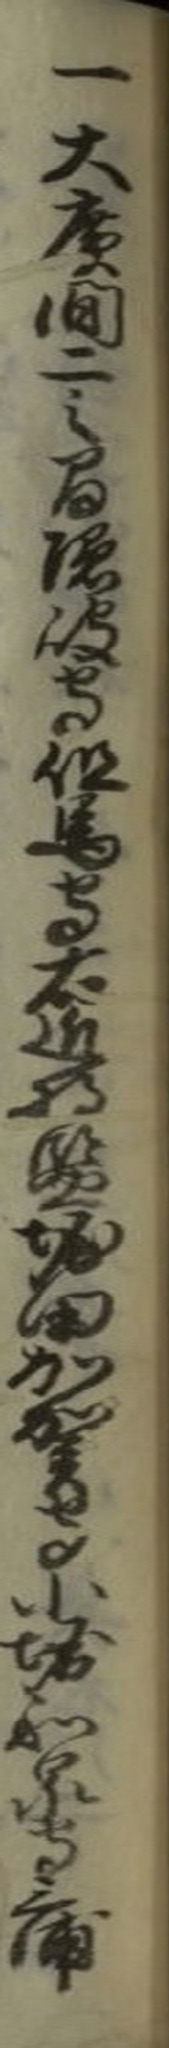一大広間二之間隠岐守但馬守右近将監堀田加賀守小堀和泉守三浦
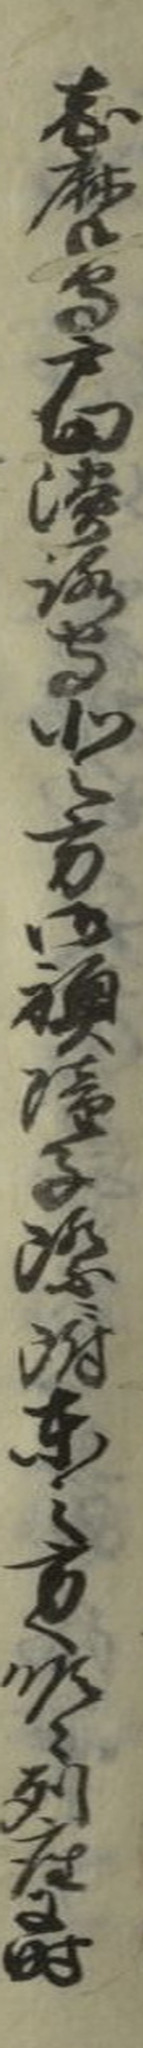志摩守戸田淡路守北之方御襖障子際に附東之方へ順々列座于時
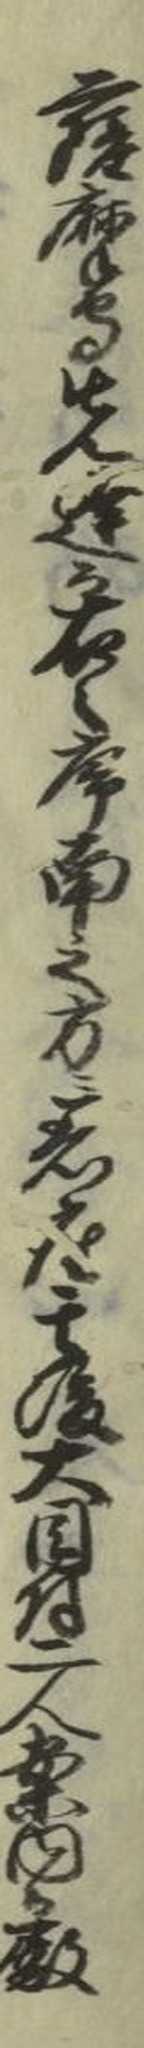薩摩守先達而右之席南之方に着座其後大目付二人案内而殿
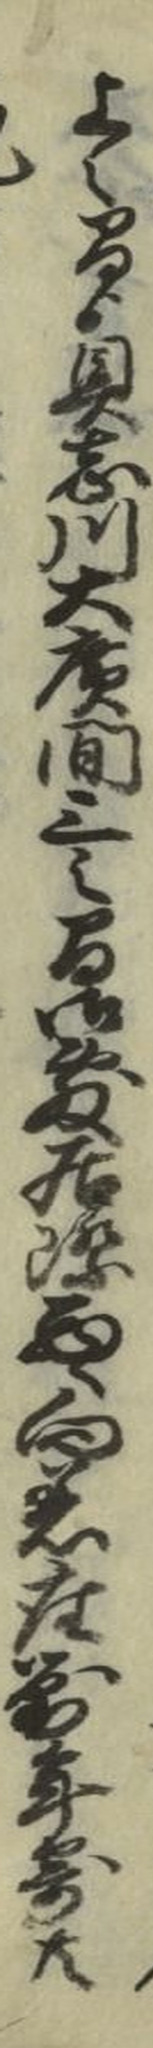上之間因りゟ具志川大広間三之間御敷居際西へ向着座別年寄共
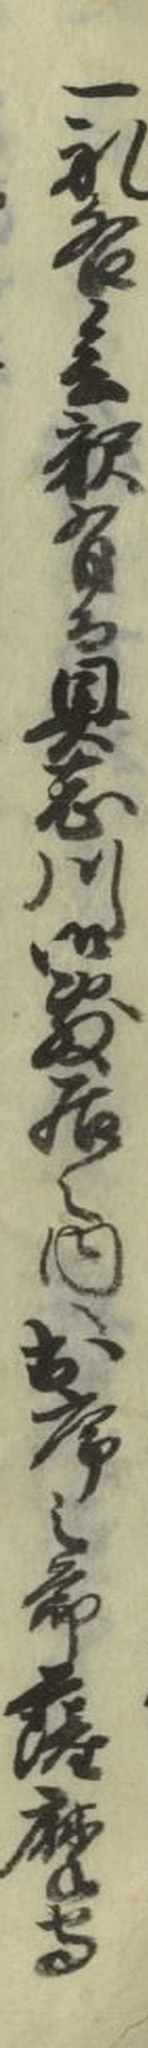一礼各会釈有而具志川御敷居之内へ出席之節薩摩守
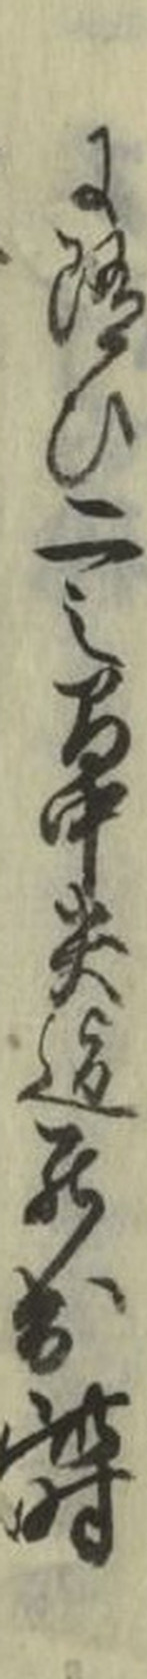に随ひ二之間中央迄罷出此時
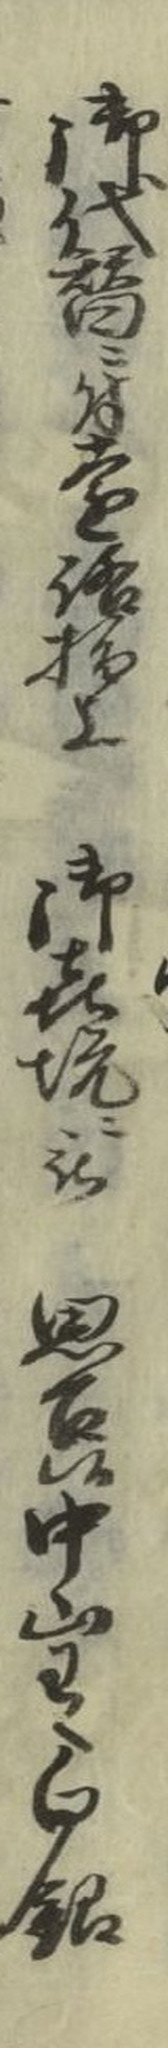御代替に付遠路指上御喜悦に被思召候中山王へ白銀
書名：琉球人来朝之記
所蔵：University of the Ryukyus Library
